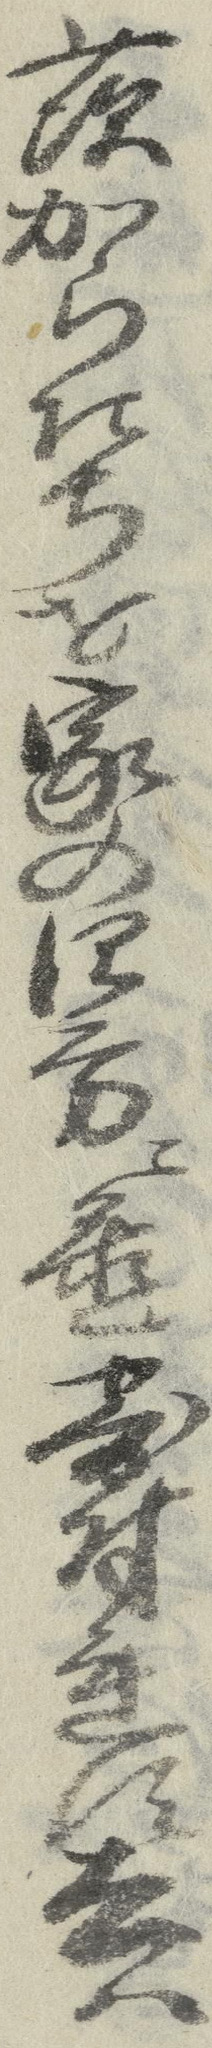茨からたちを家の四方置寄付れす去は
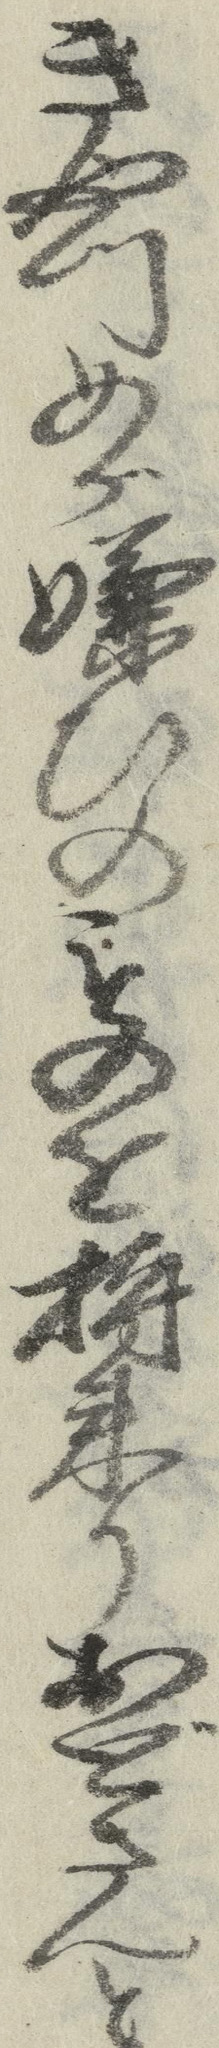きやつめが嫌ひのものを持来りおどさんと
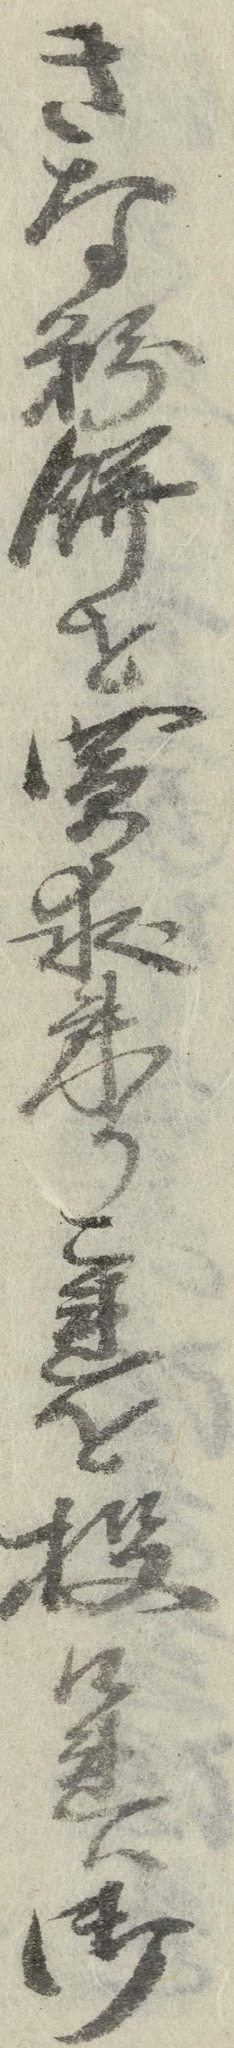きな粉餅を買求来りこれを投けれは御
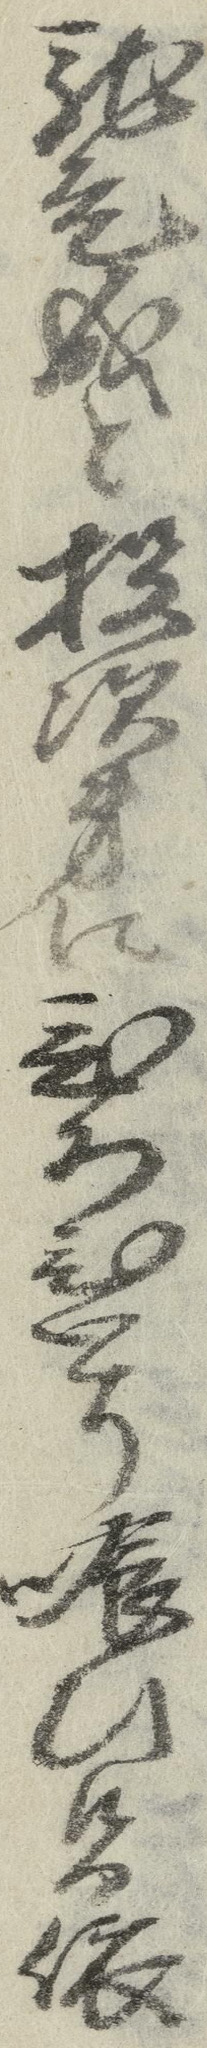馳走成と投次第にひろひとり喰ひける依
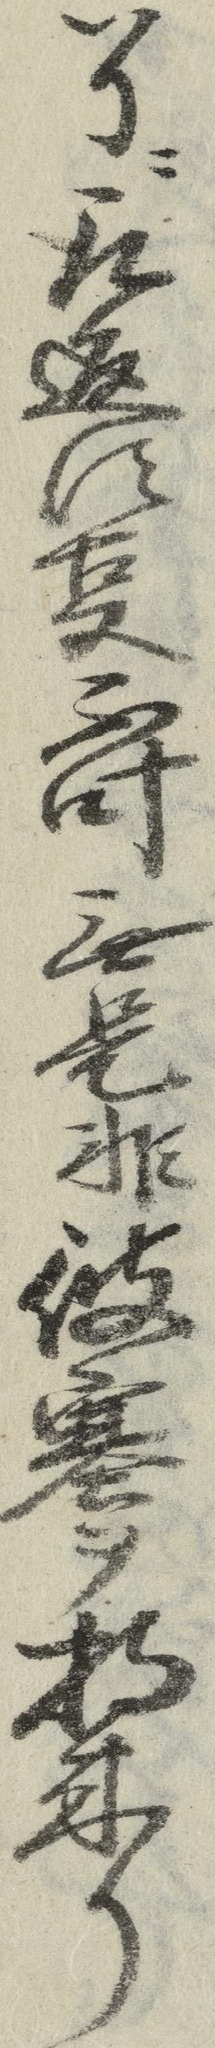了取返す事不叶無是非彼塞ヲ持来り
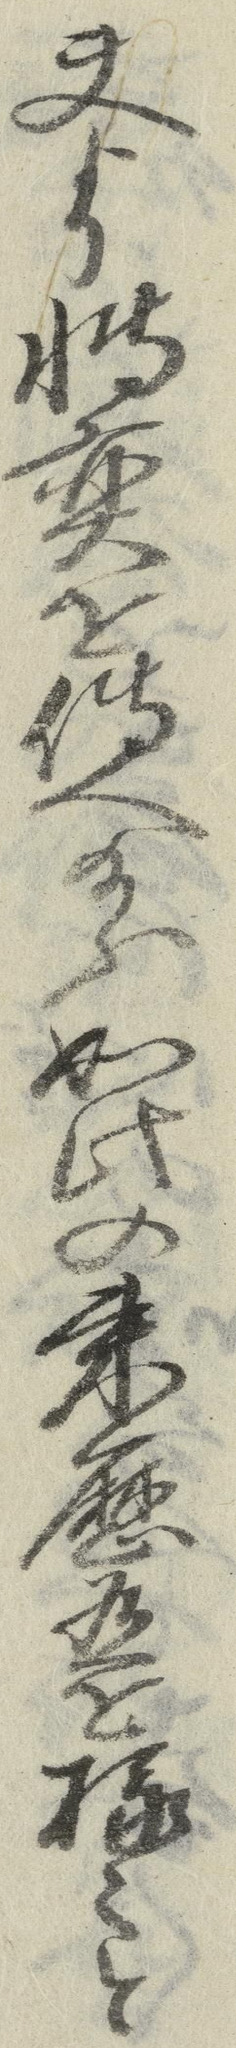夫より博奕を伝へ給ふ如此の来歴有を様々と
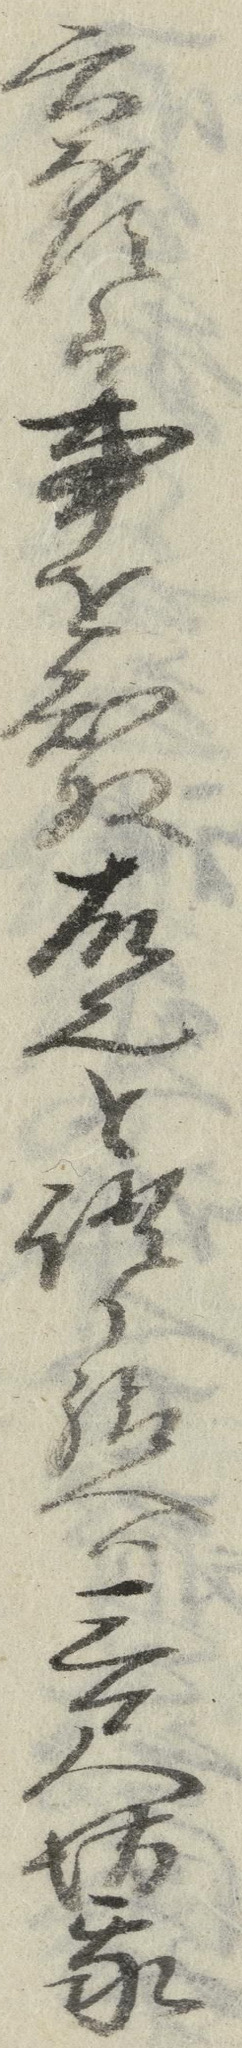云なすは事を知ぬ故也と語り給へは三尺坊我
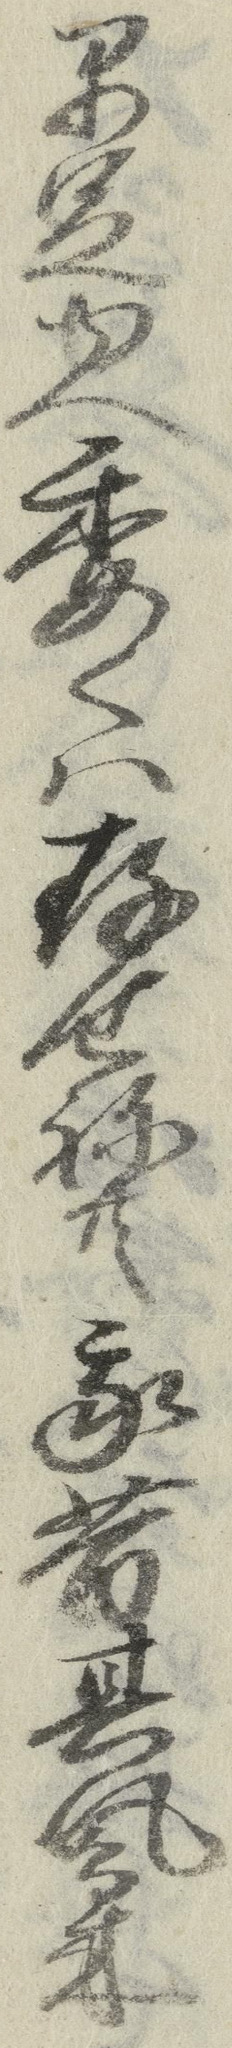早足ゆへ委くは存せね共我昔其鳳来
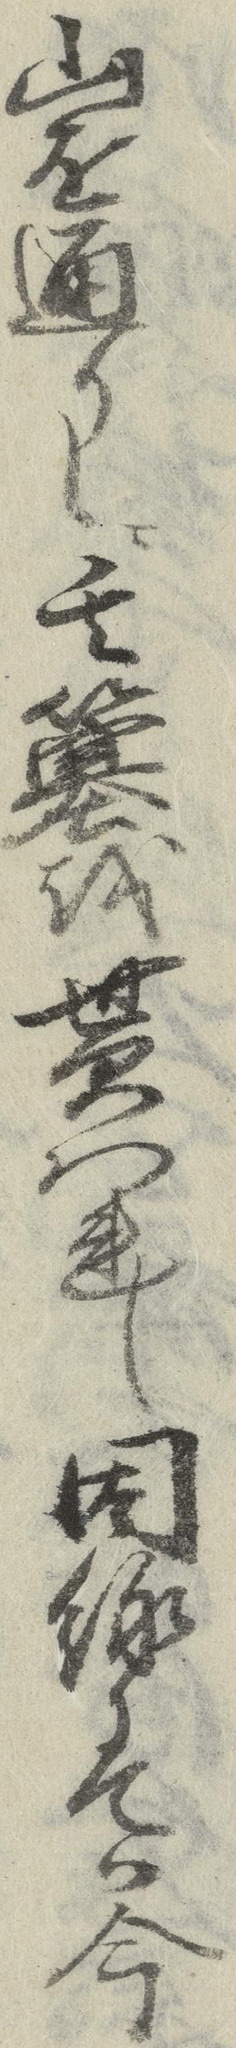山を通りし其塞を貰はれし因縁にては今
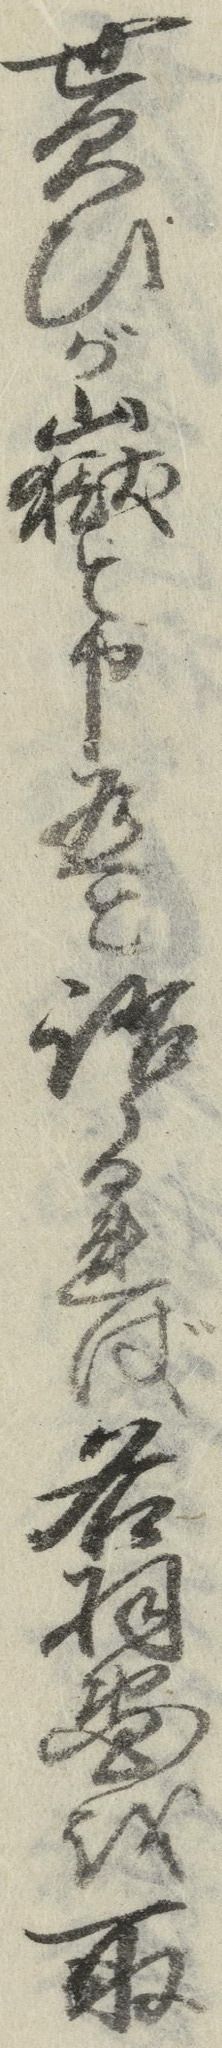貰ひが嶽と申有と語らるれば各羽団を取
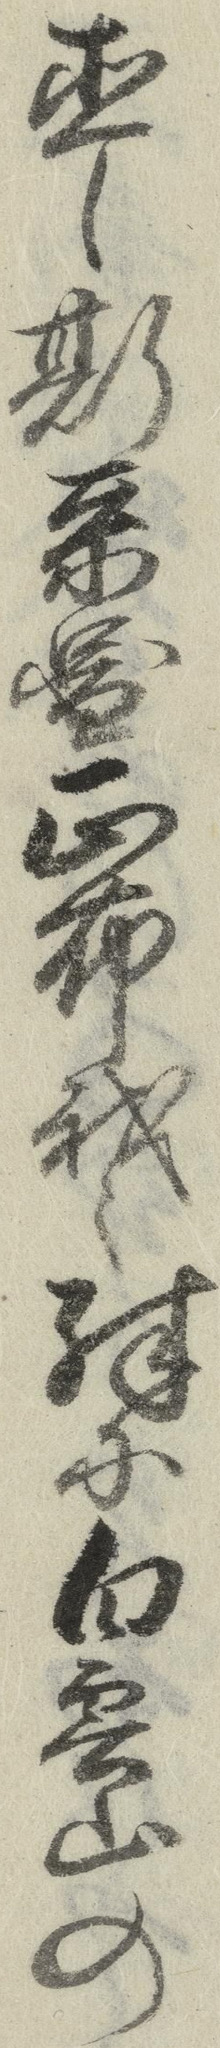直し斯系図正布我々殊に白雲山の
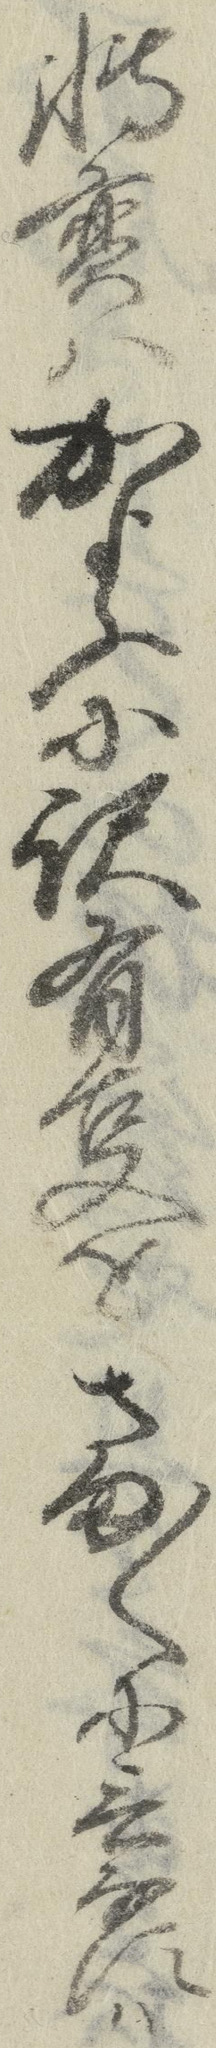博奕はかよふに訳有事をさま〳〵に言なすは

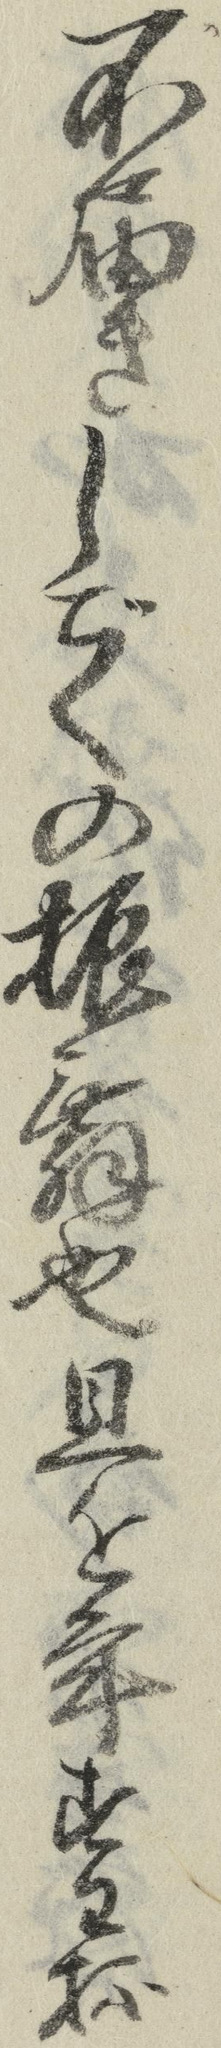不届きしごくの振舞也且近年すわ抔
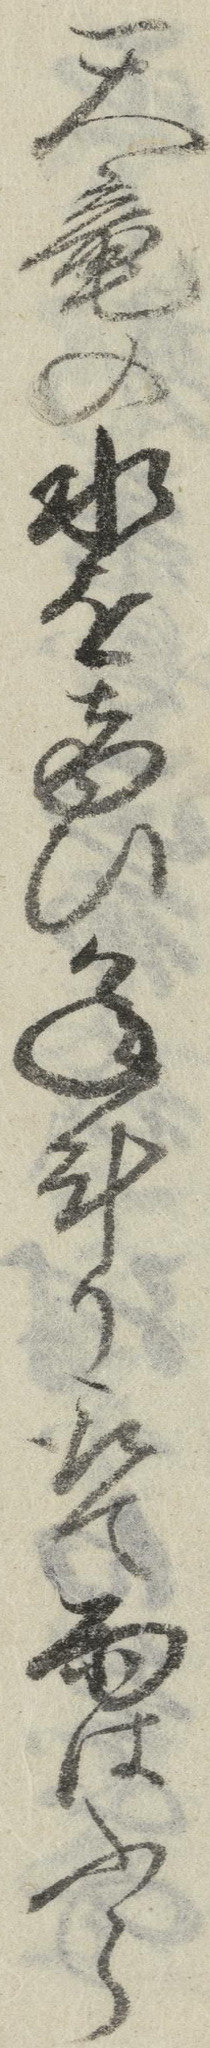天竜の水を商ひかね計り取て雨はふら
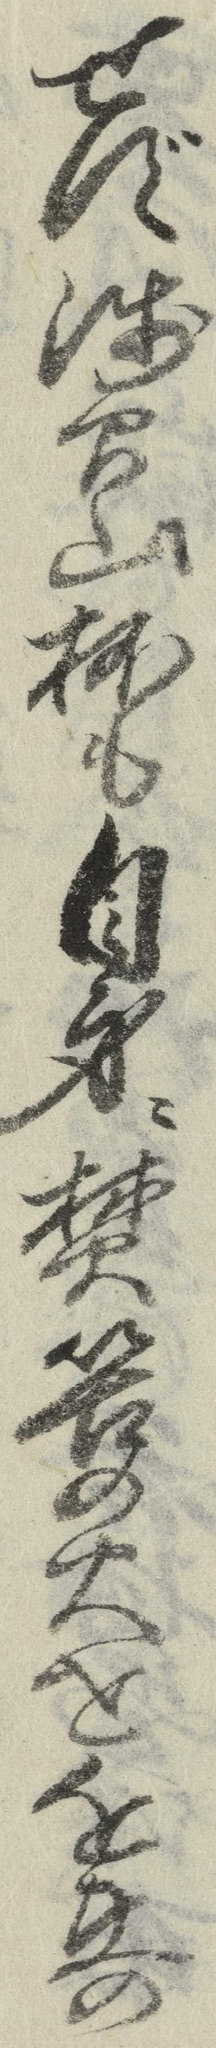せず浅間山抔も自身に焚筈の火を近在の
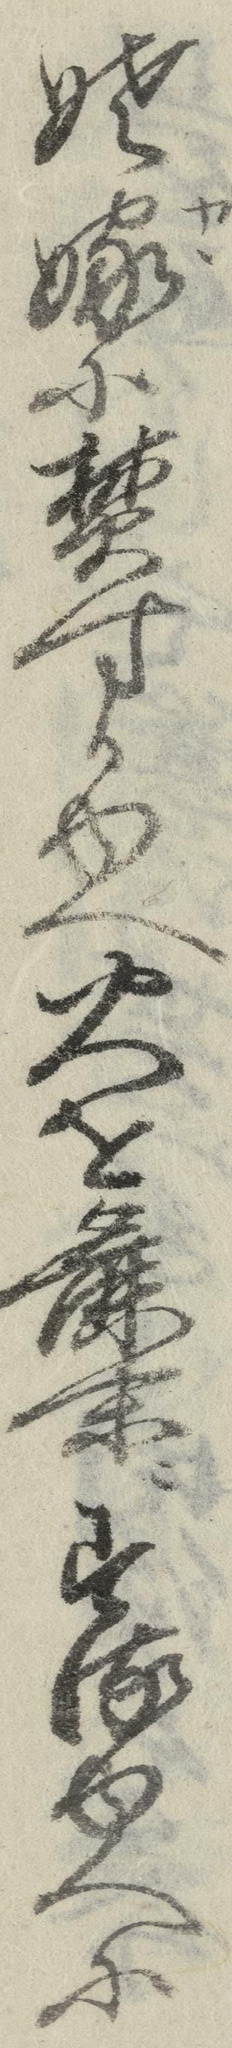姥嫁に焚するゆへ火を麁末にするゆへに
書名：浅間大焼騒動記　上
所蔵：東京大学地震研究所図書室 Earthquake Research Institute Library, The University of Tokyo, JAPAN
